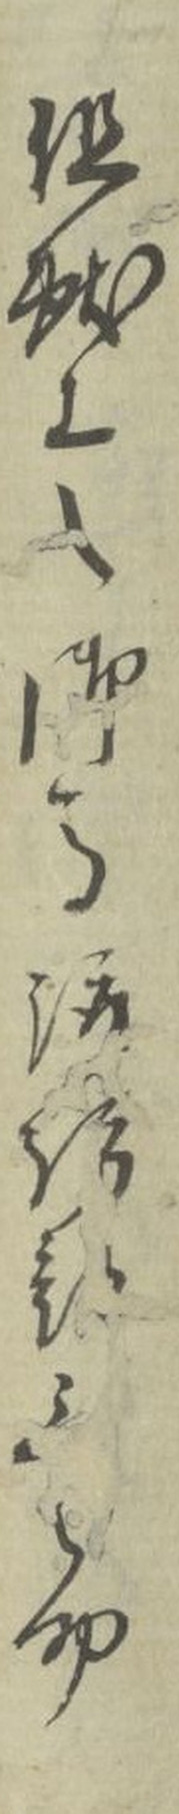但献上之御馬諏訪部三之助
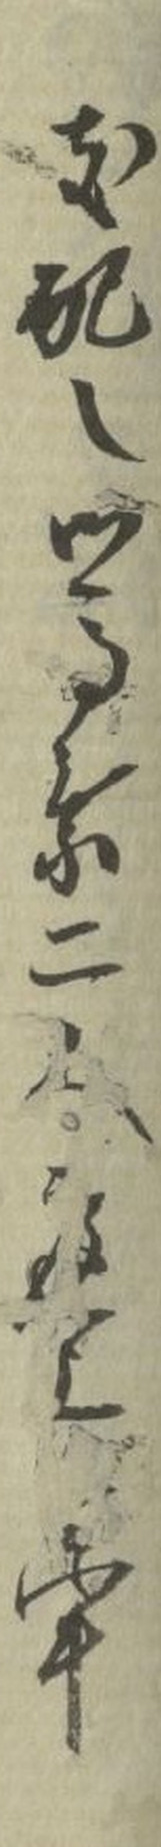支配之御馬乗二人庭上牽
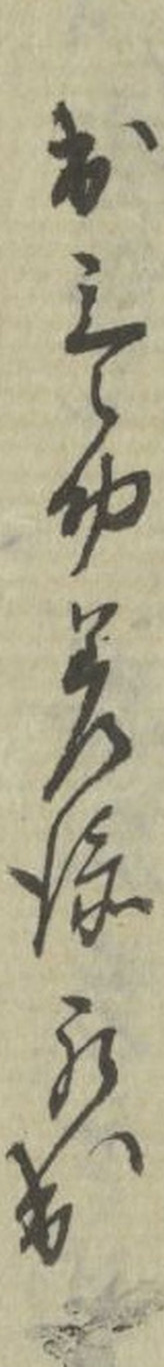出三之助差添罷出
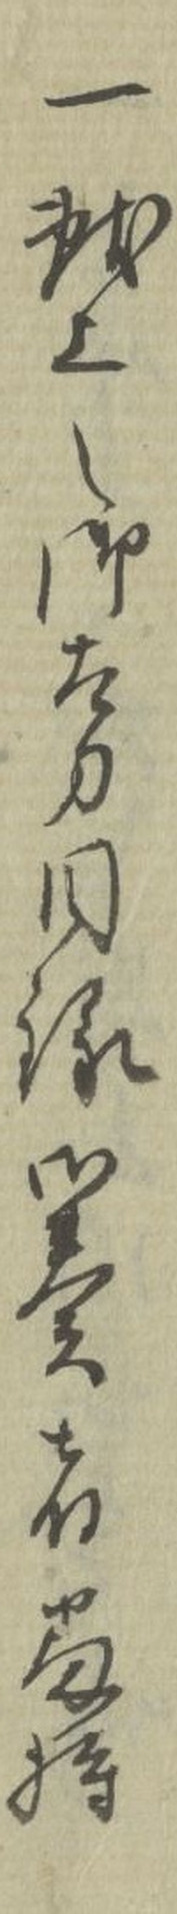一献上之御太刀目録御奏者番持
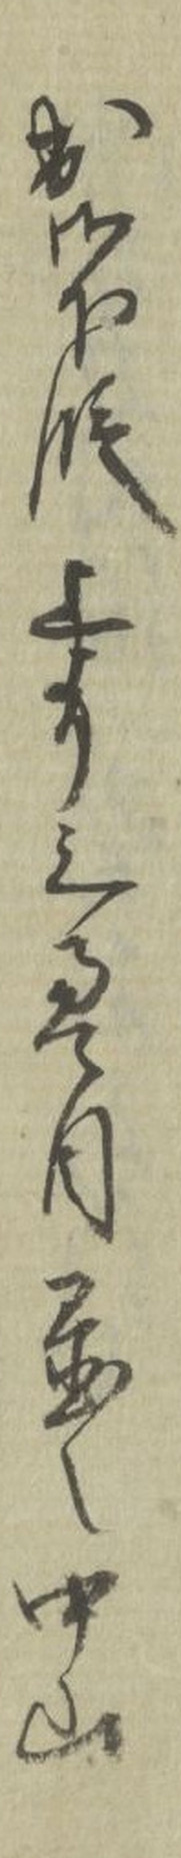出御下段上より三畳目置之中山
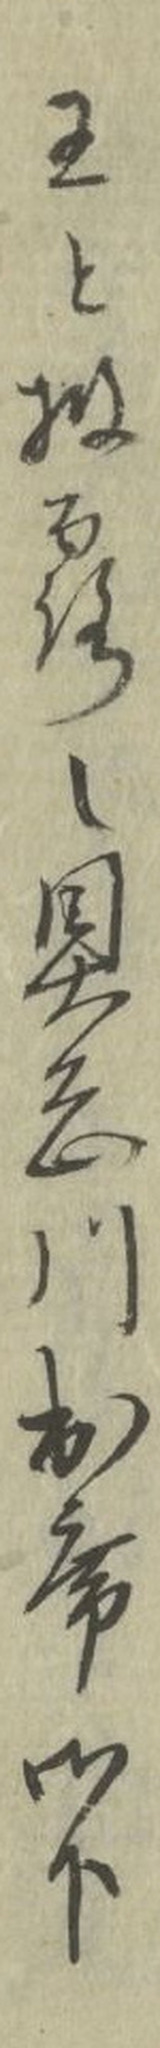王と披露之具志川出席御下

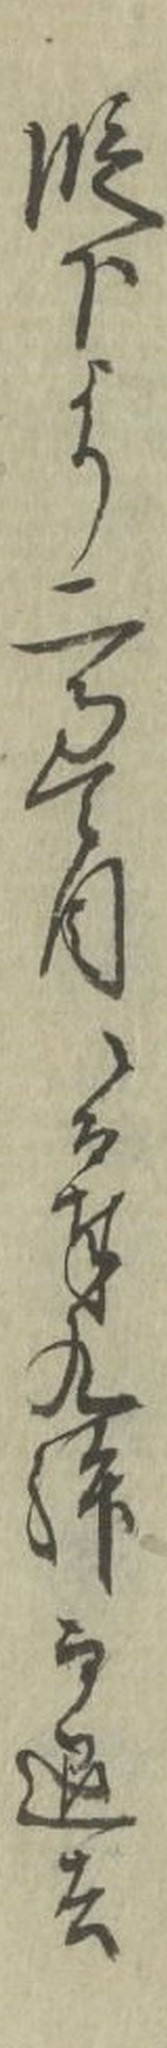段下より二畳目に而奉九拝而退去
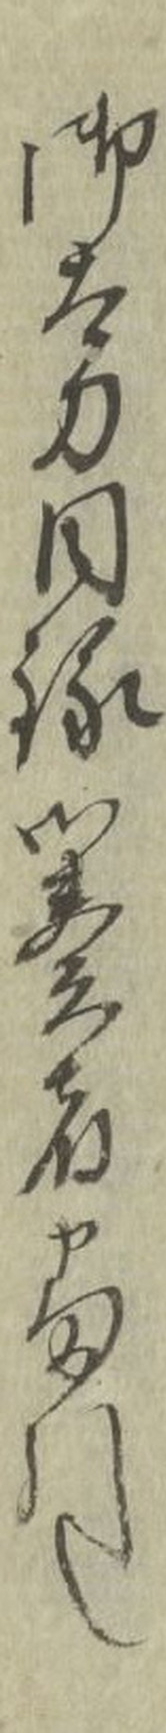御太刀目録御奏者番引之
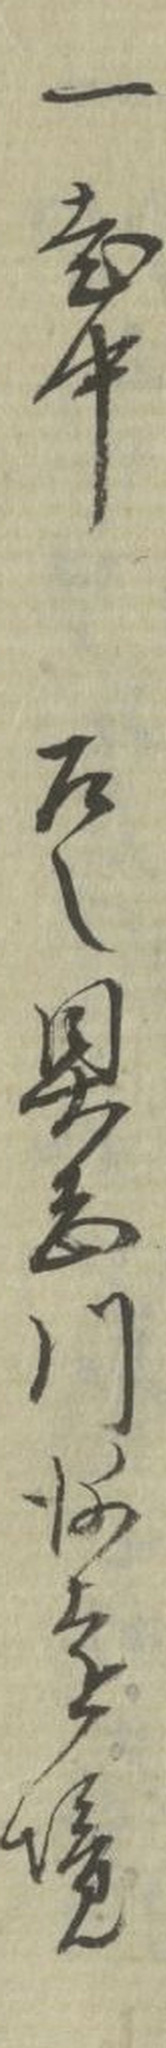一老中召之具志川儀遠境
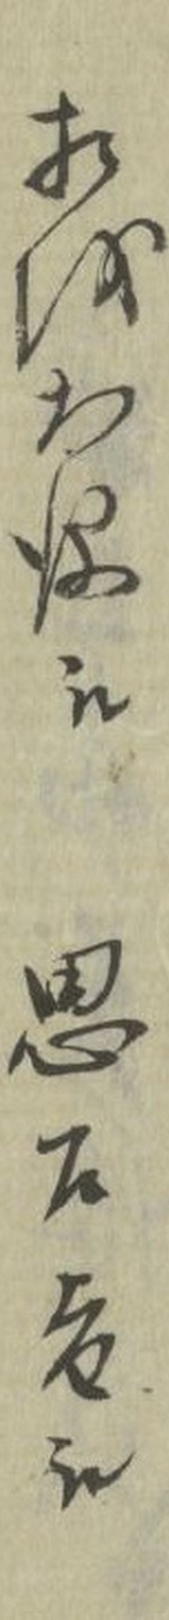相越太儀被思召旨被
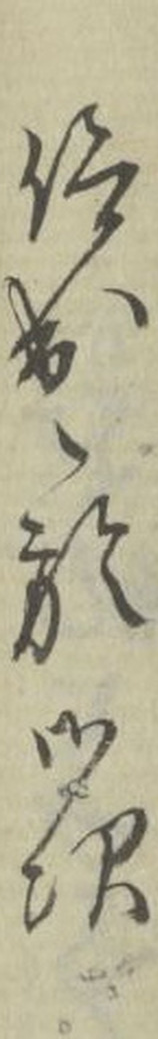仰出之於御次
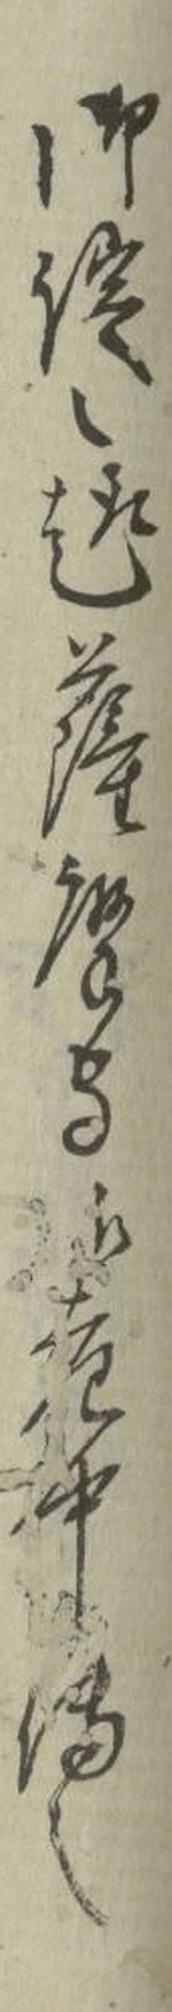御諚之趣薩摩守え老中伝之
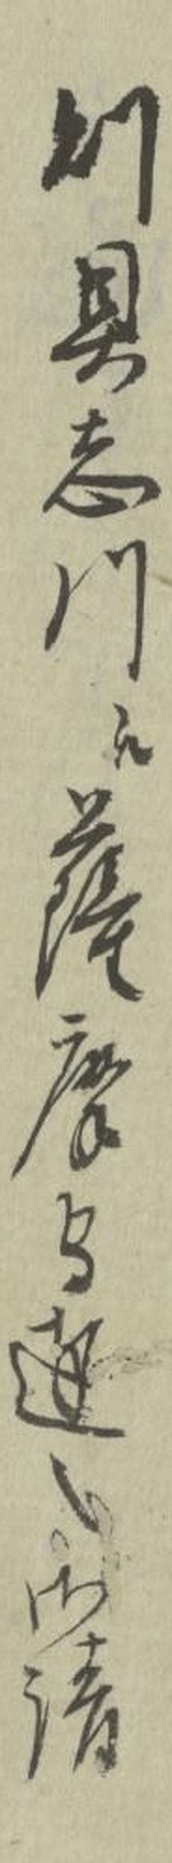則具志川え薩摩守達之御請
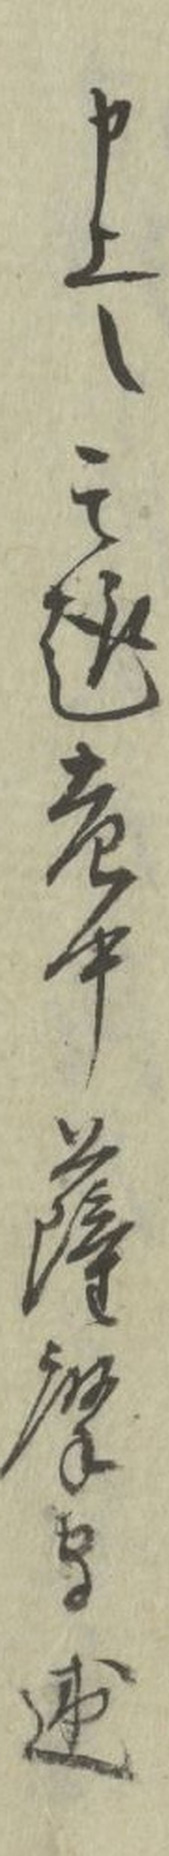申上之其趣老中薩摩守述
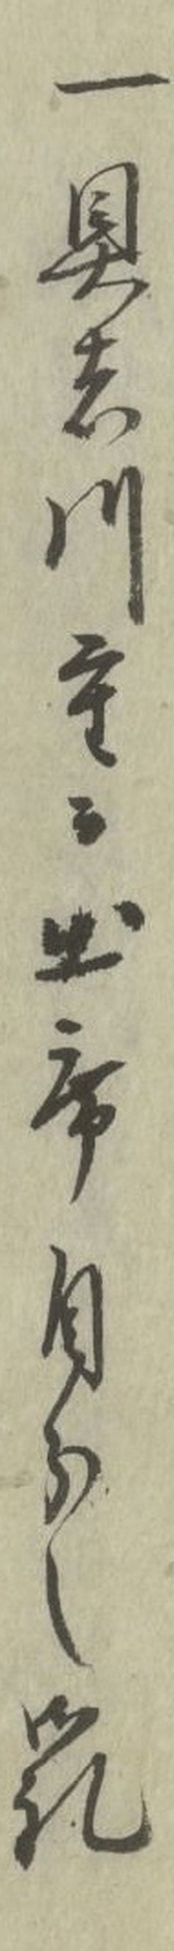一具志川重而出席自分之御礼

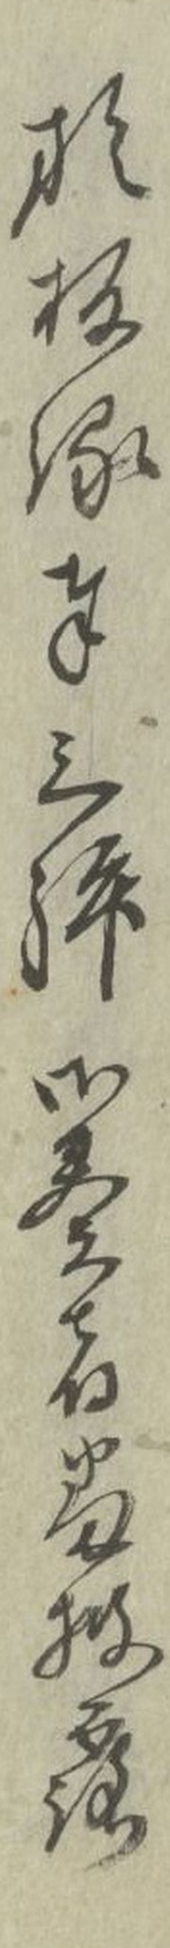於板縁奉三拝御奏者番披露
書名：琉球来朝記 自八至十四終
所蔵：University of the Ryukyus Library
